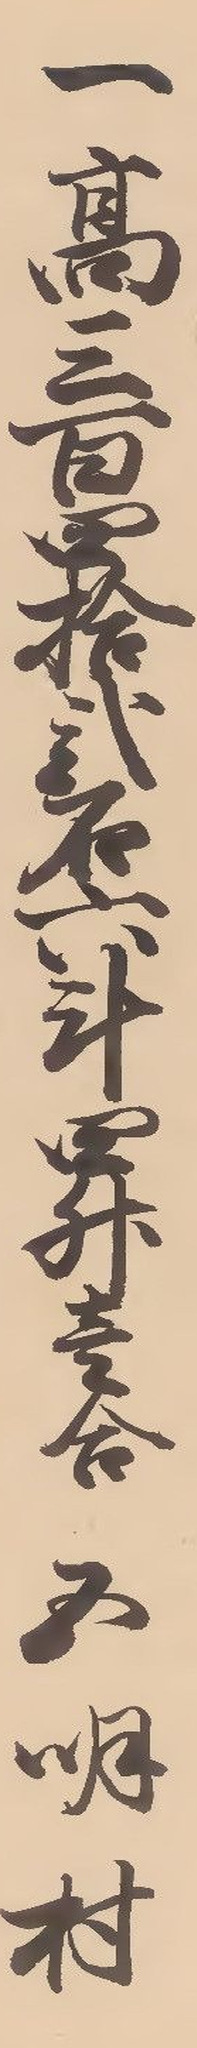一高三百四拾弐石六斗四升壱合五明村
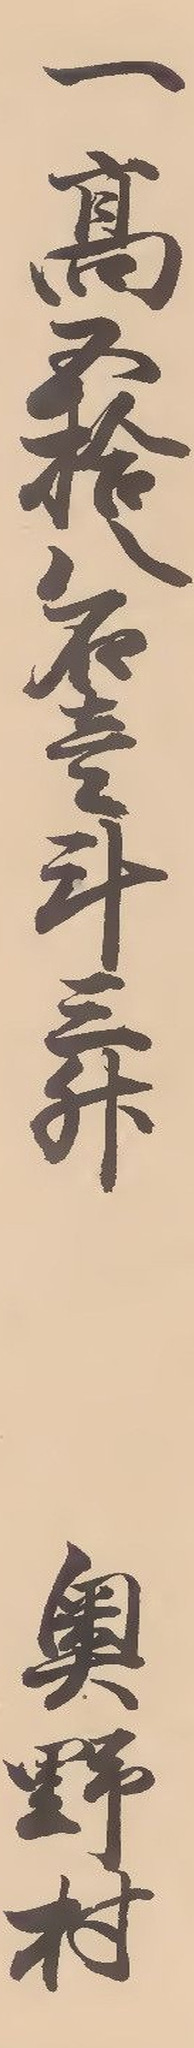一高五拾八石壱斗三升奥野村
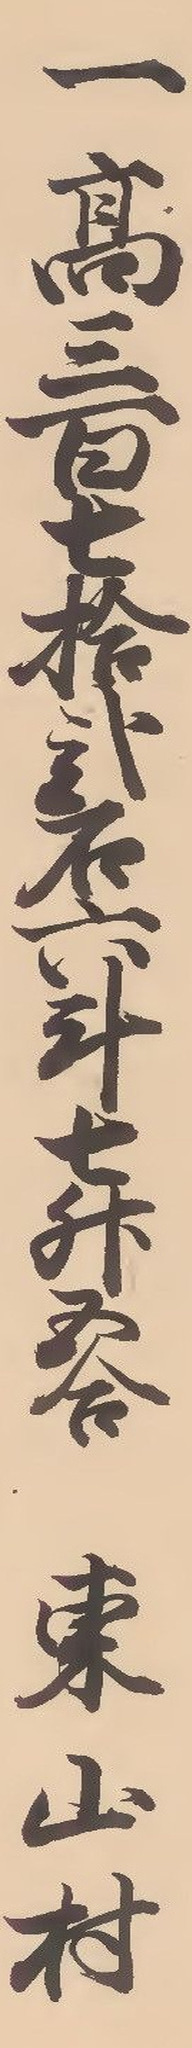一高三百七拾弐石六斗七升五合東山村
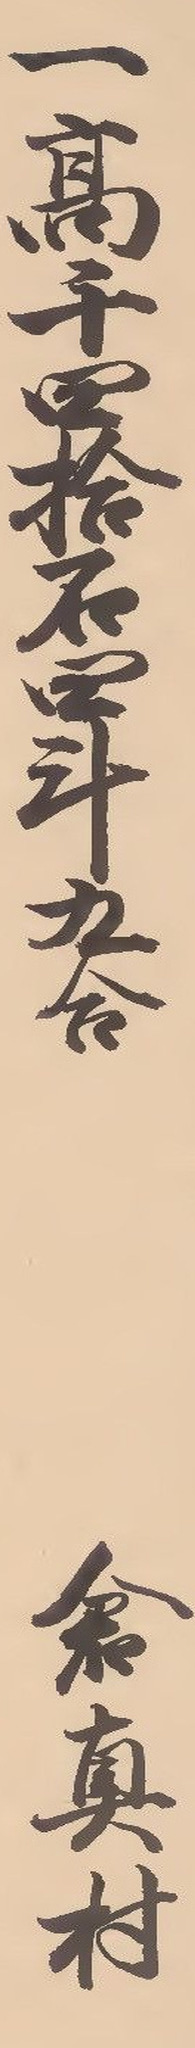一高千四拾石四斗九合倉真村
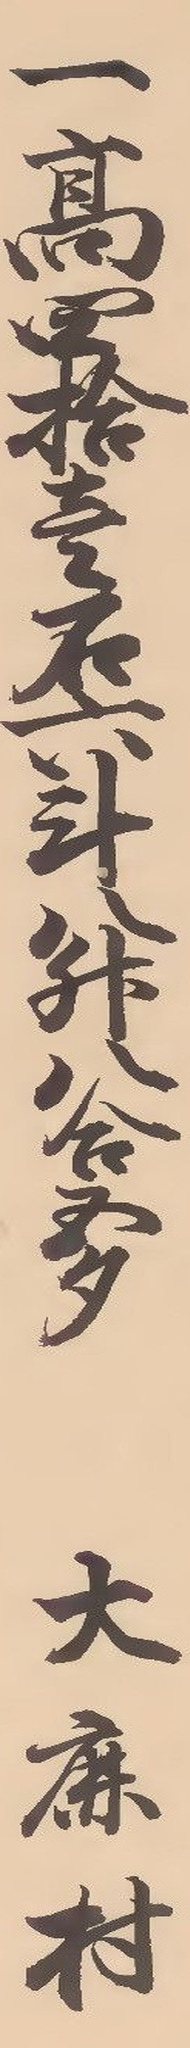一高四拾壱石六斗八升八合五勺大鹿村
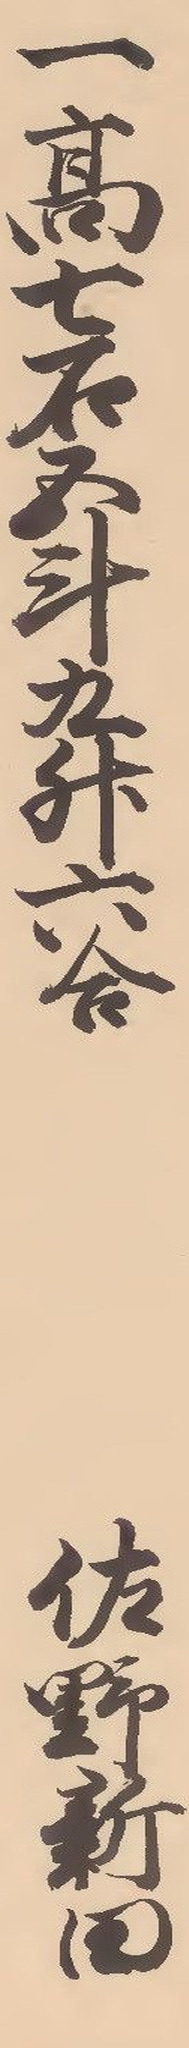一高七石五斗九升六合佐野新田
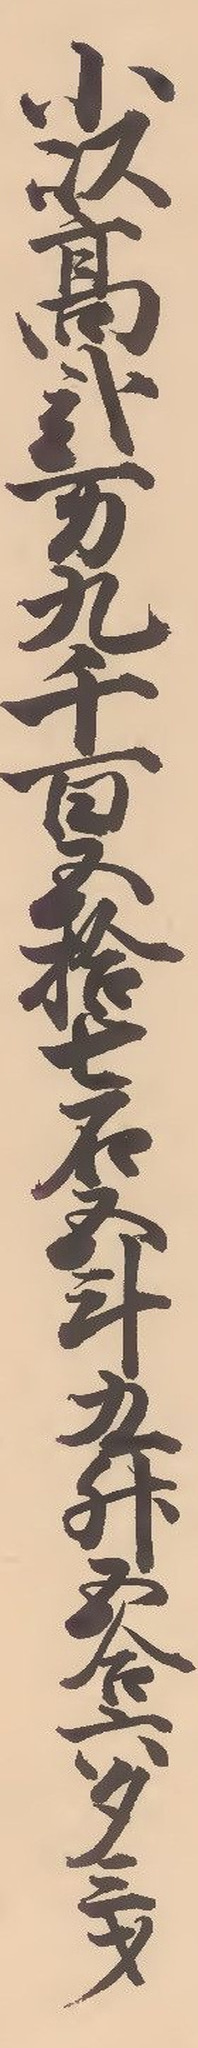小以高弐万九千百五拾七石五斗九升五合六勺三才

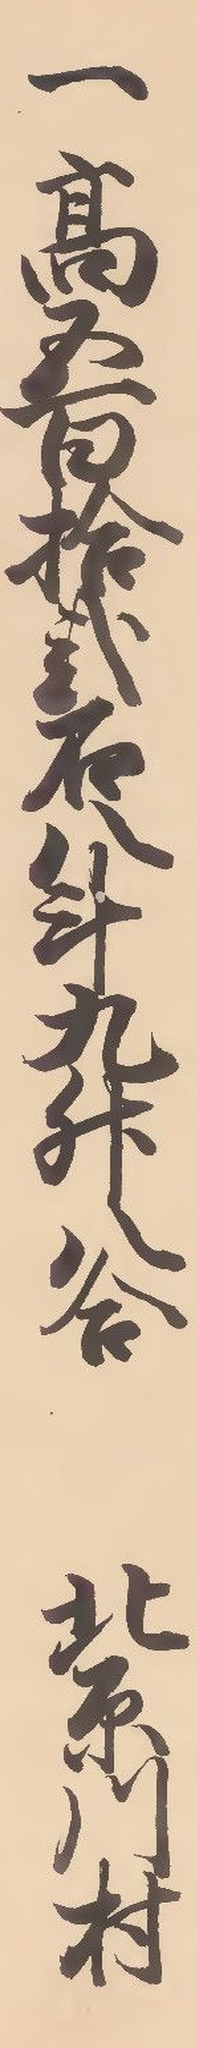一高五百拾弐石八斗九升八合北原川村
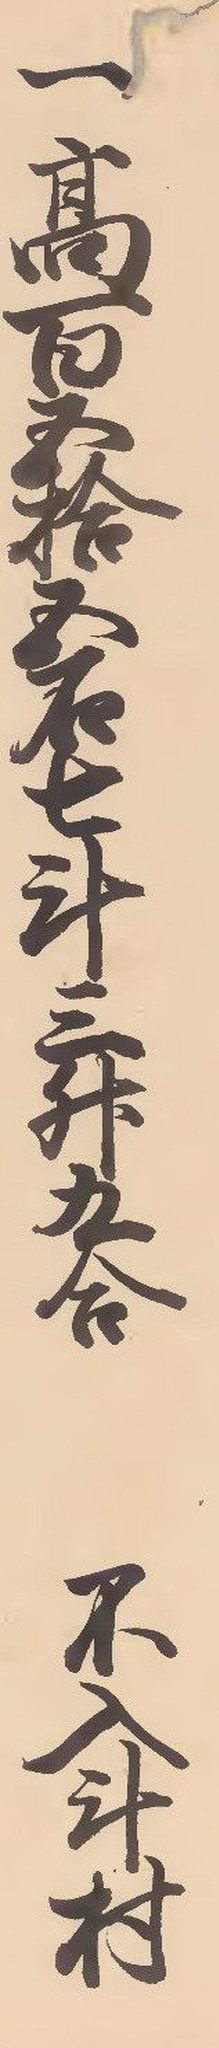一高百五拾五石七斗三升九合不入斗村
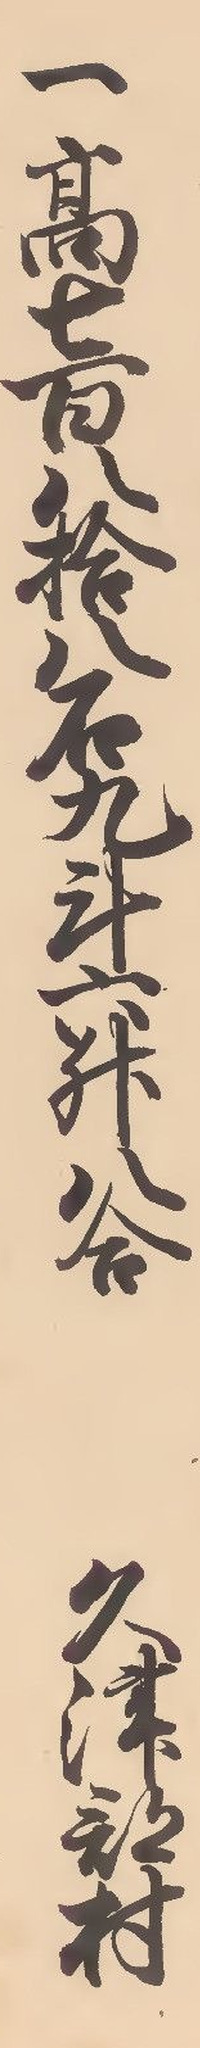一高七百八拾八石九斗六升八合久津部村

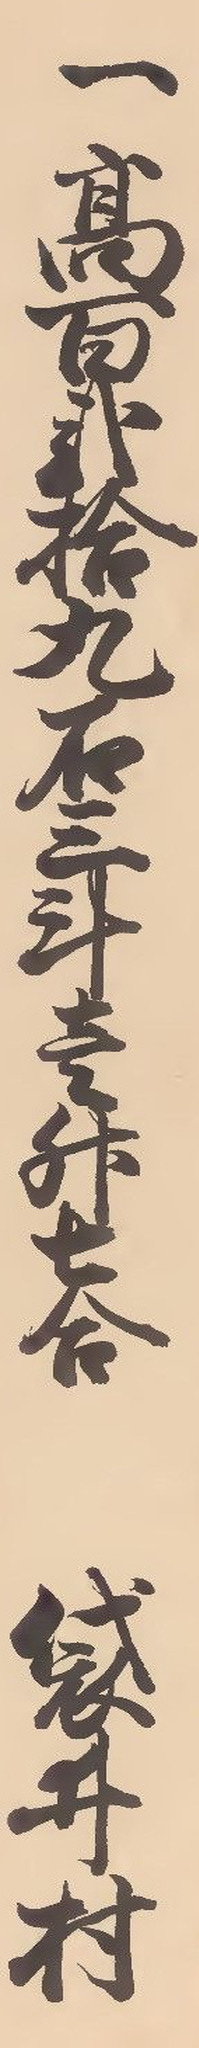一高百弐拾九石三斗壱升七合袋井村
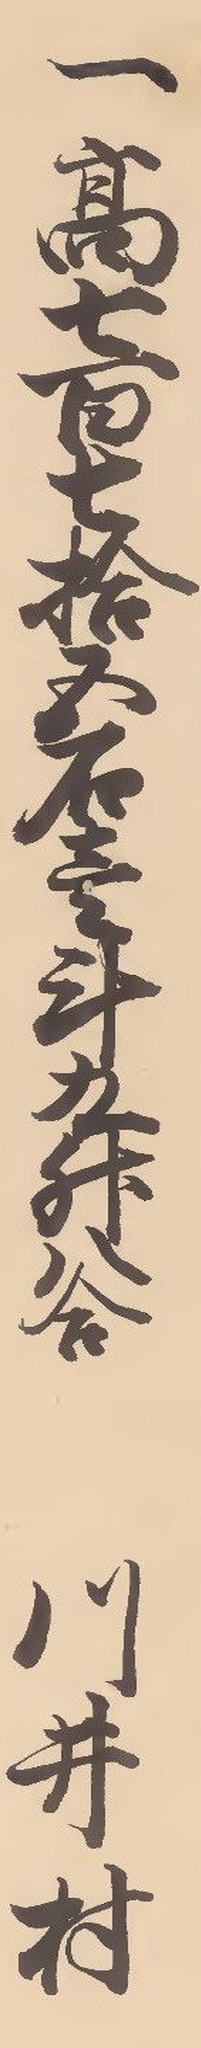一高七百七拾五石壱斗九升八合川井村
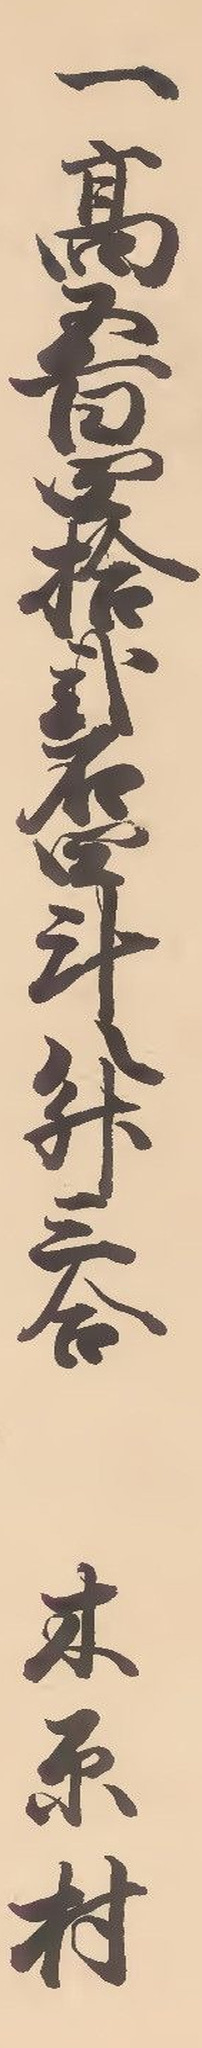一高五百四拾弐石四斗八升三合木原村
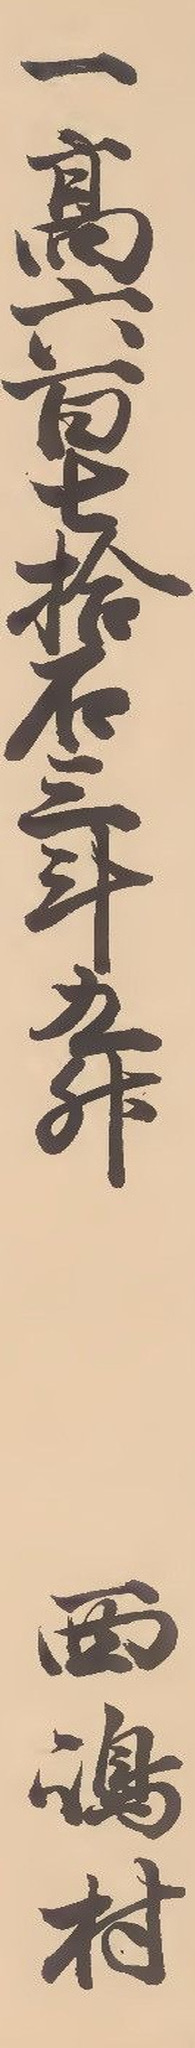一高六百七拾石三斗九升西島村
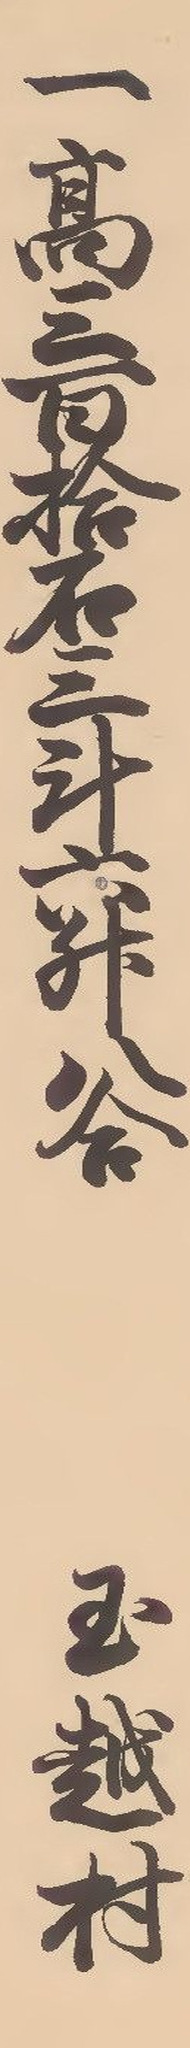一高三百拾石三斗六升八合玉越村
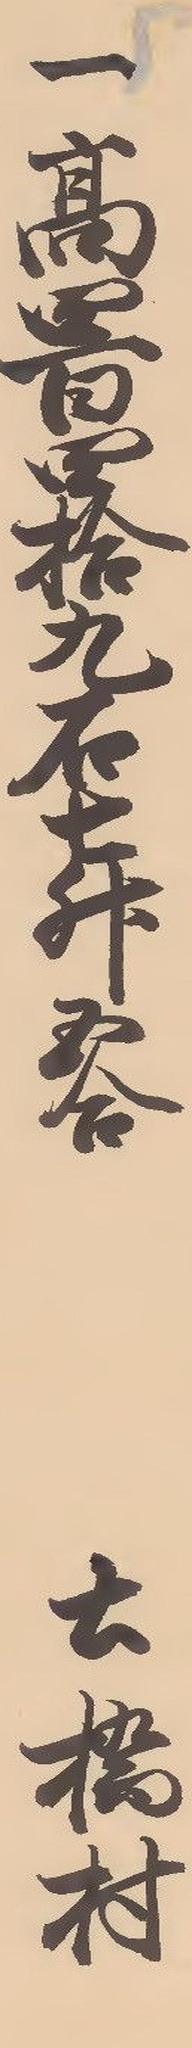一高四百四拾九石七升五合土橋村
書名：遠江国郷帳
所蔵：国立公文書館 National Archives of Japan
